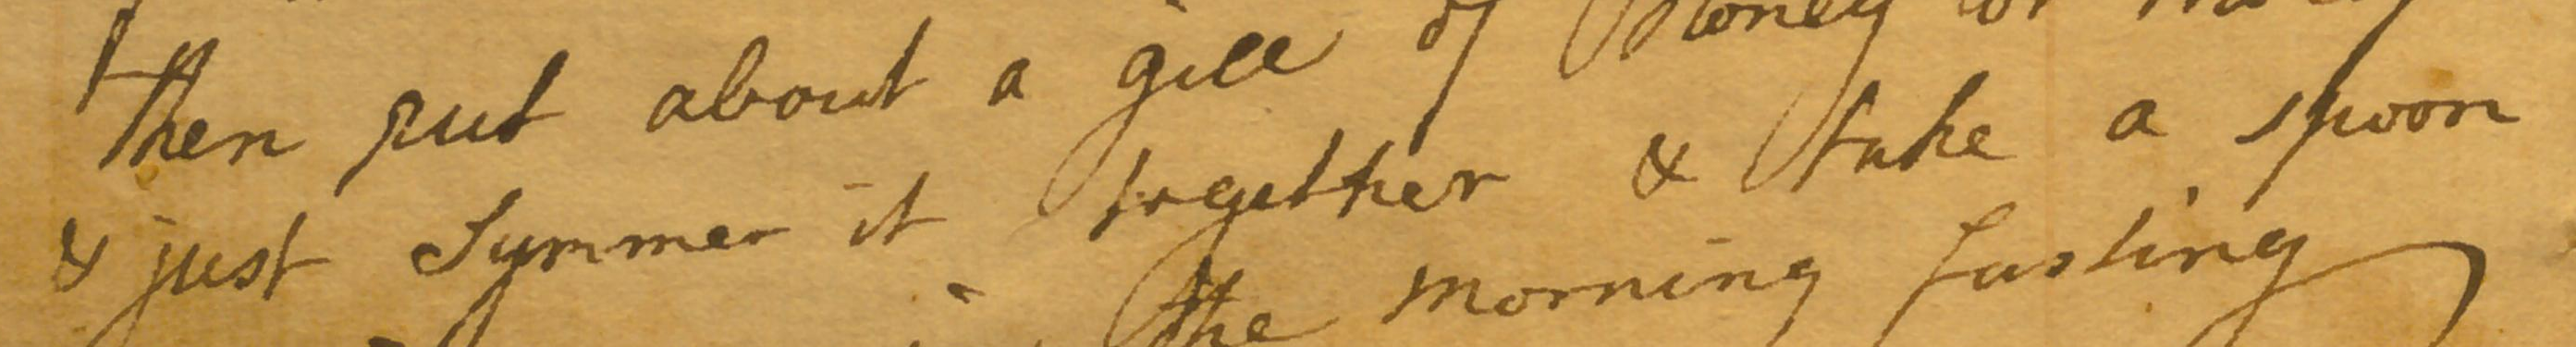& just symmer it together & take a spoon
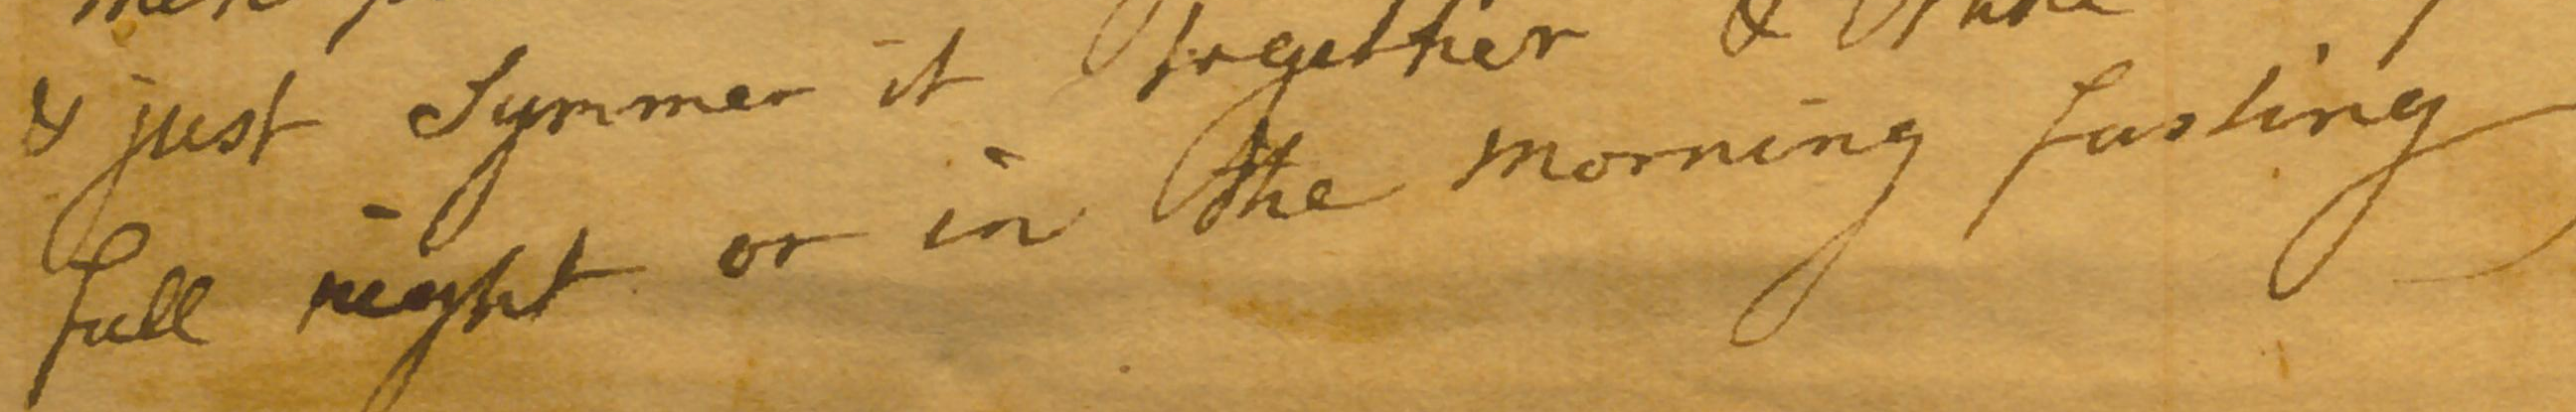full night or in the morning fasting
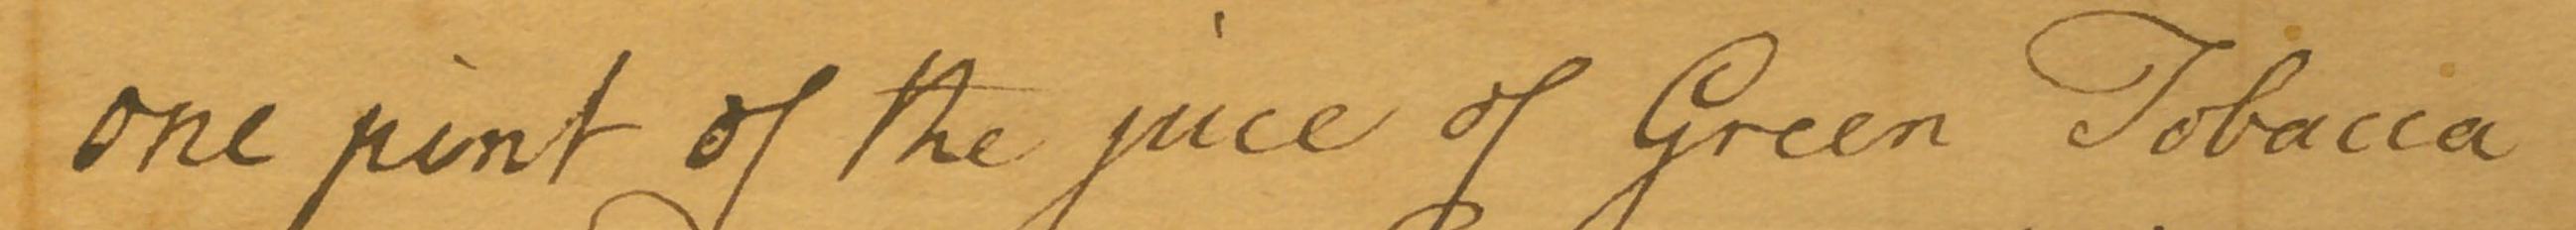one pint of the juice of Green Tobacca
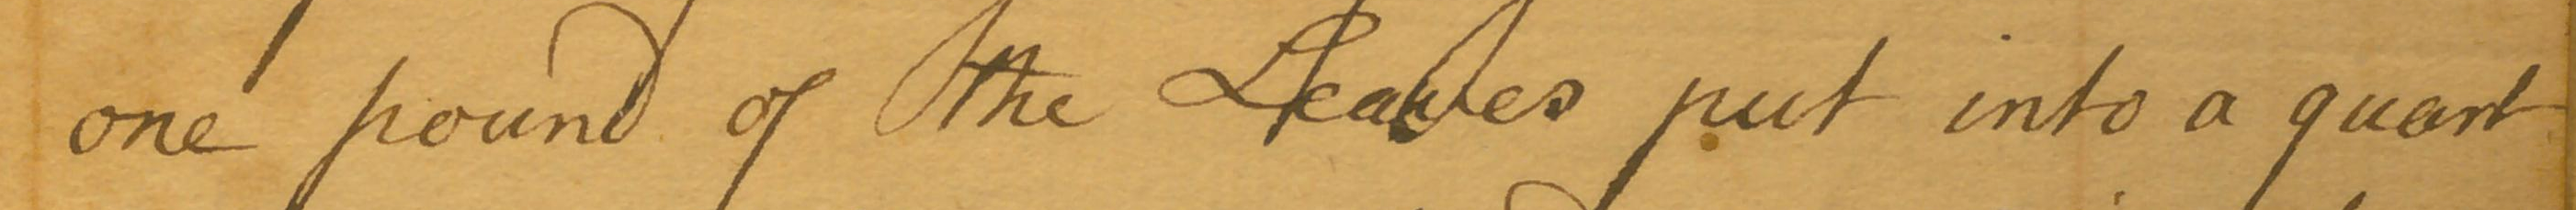one pound of the Leaves put into a quart
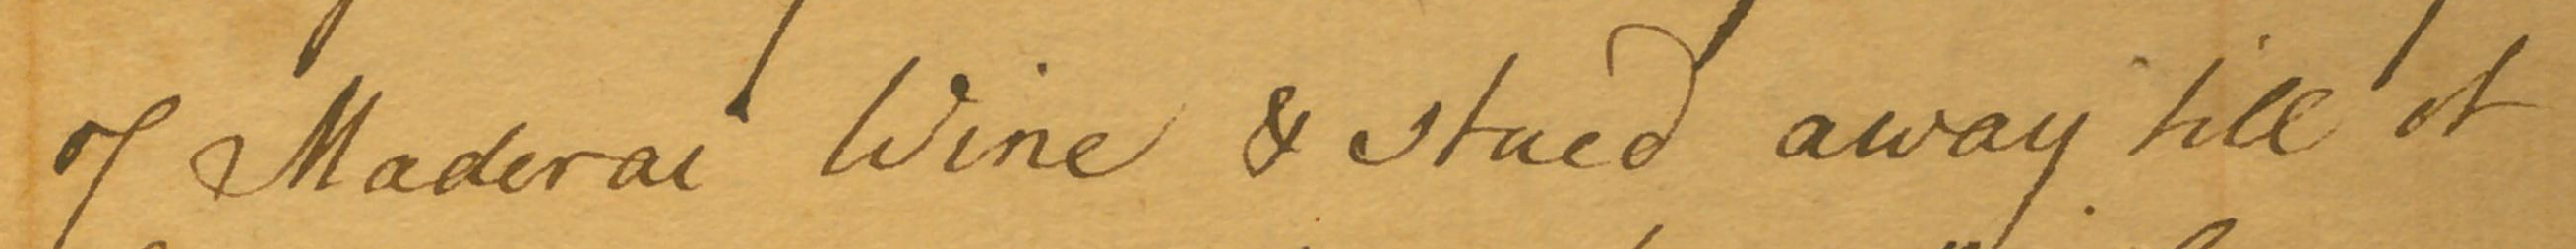of Maderai Wine & stued away till it
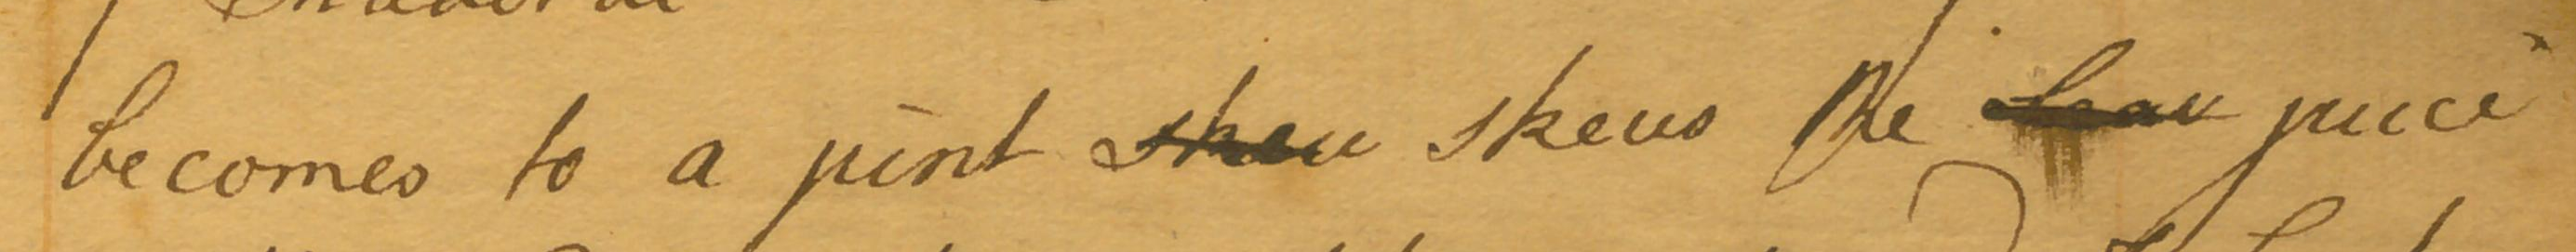becomes to a pint [skeu] skew the [Leav] juice
